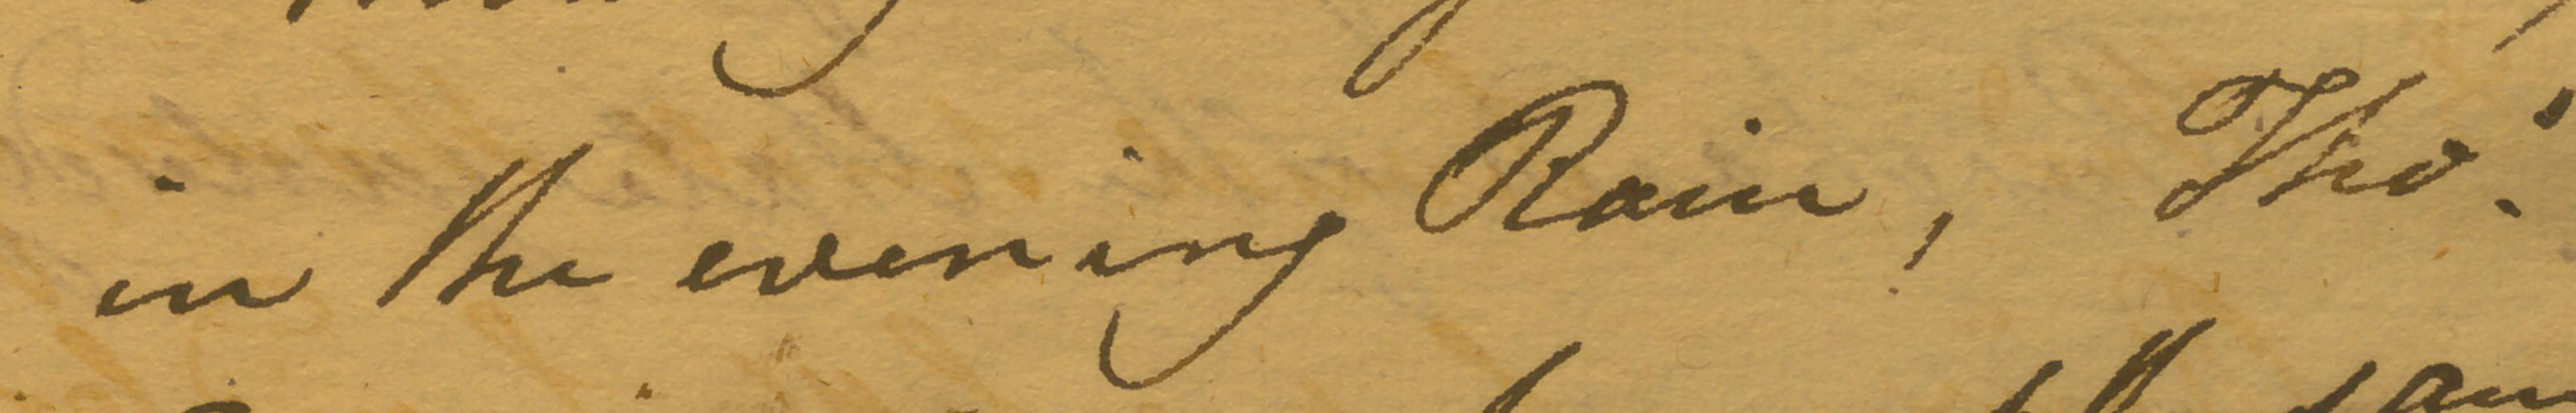in the evening Rain, Tho^s.
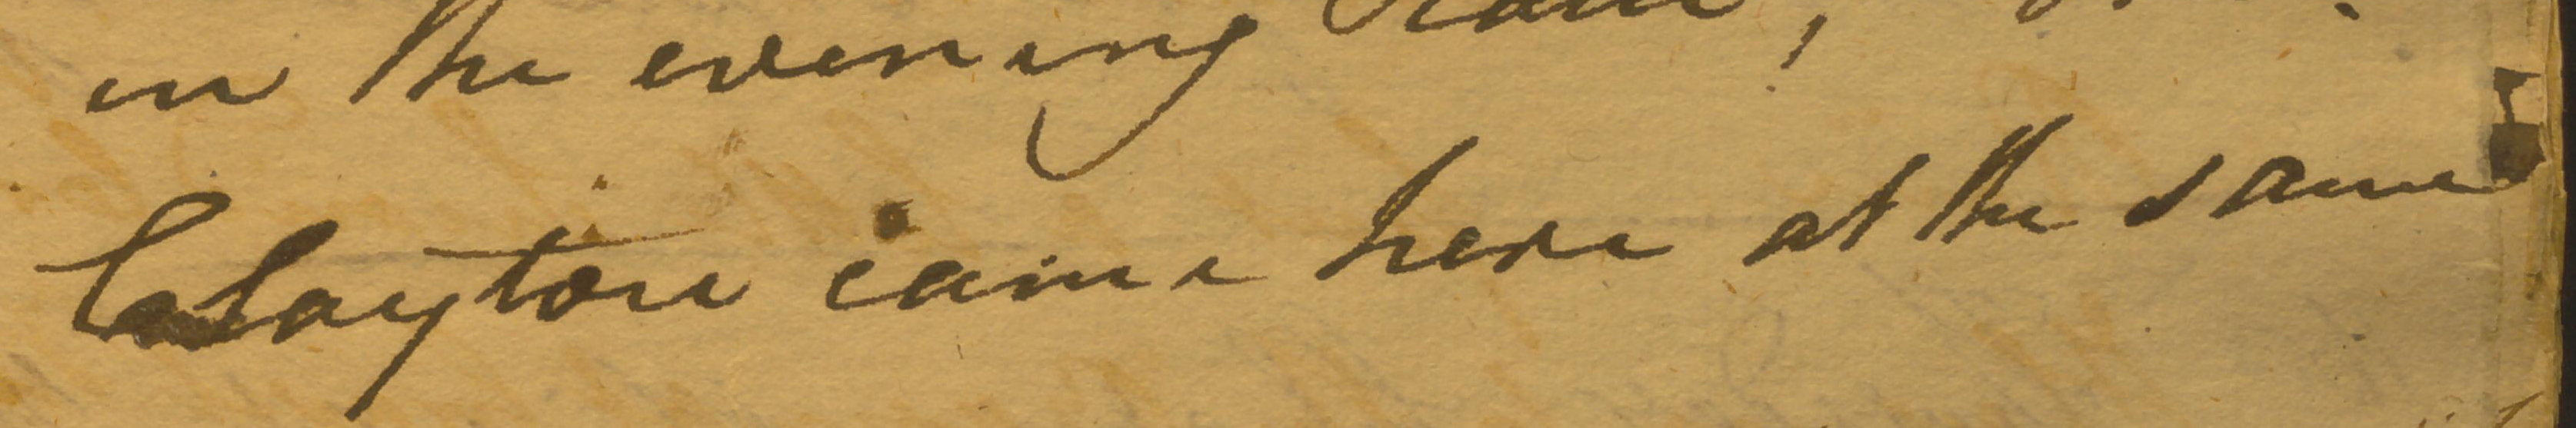Clayton came here at the same
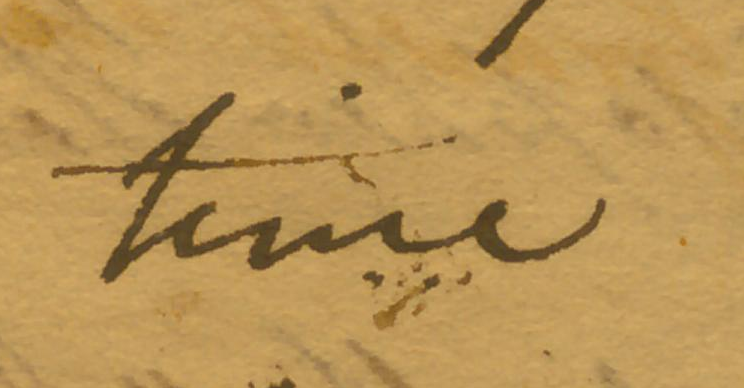time
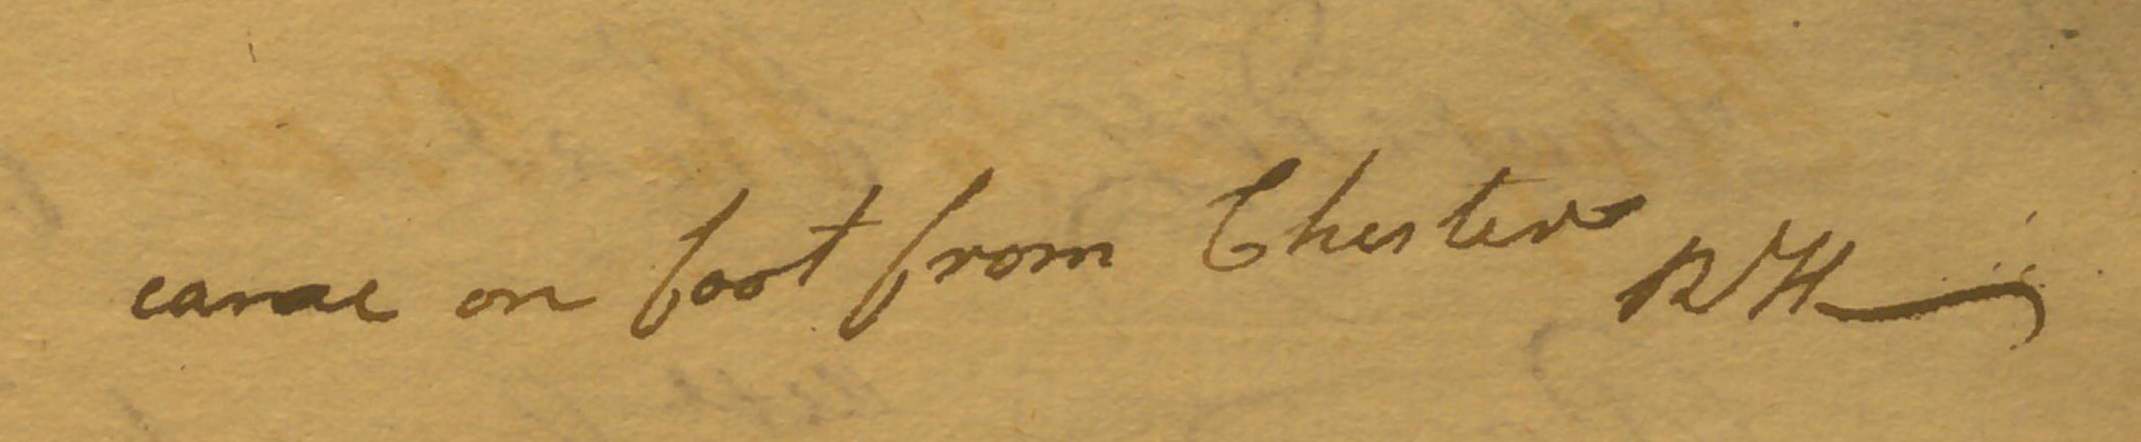camr on boot from Chester RH-
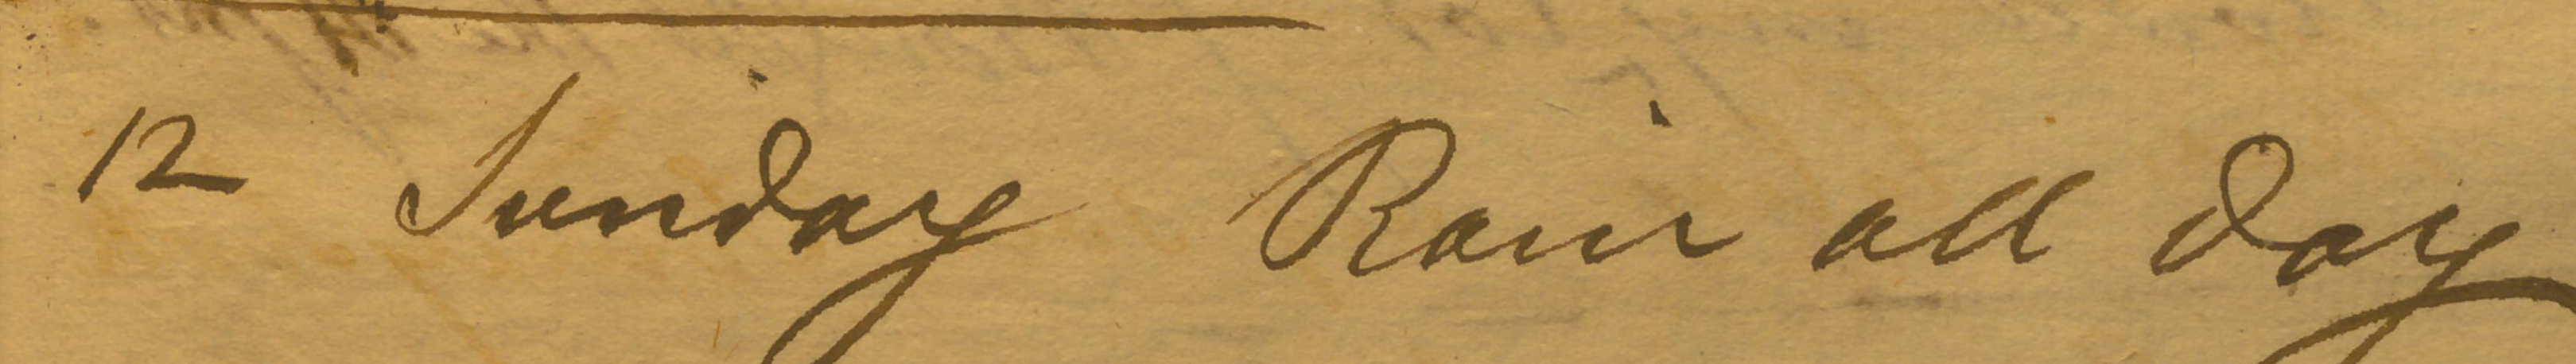12 Sunday Rain all day
